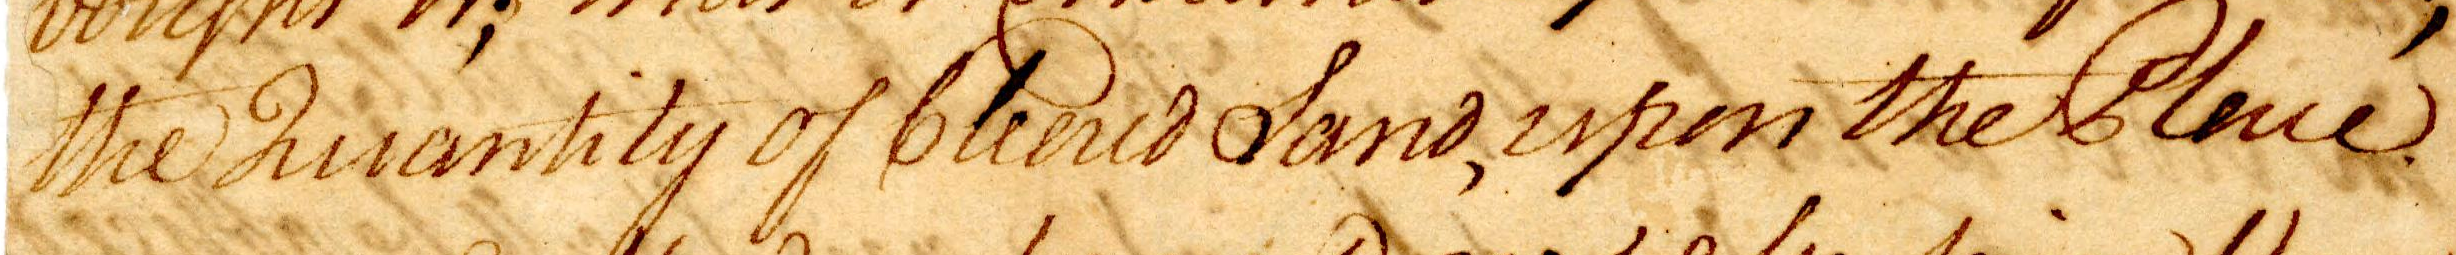the Quantity of Cleared Land upon the Place
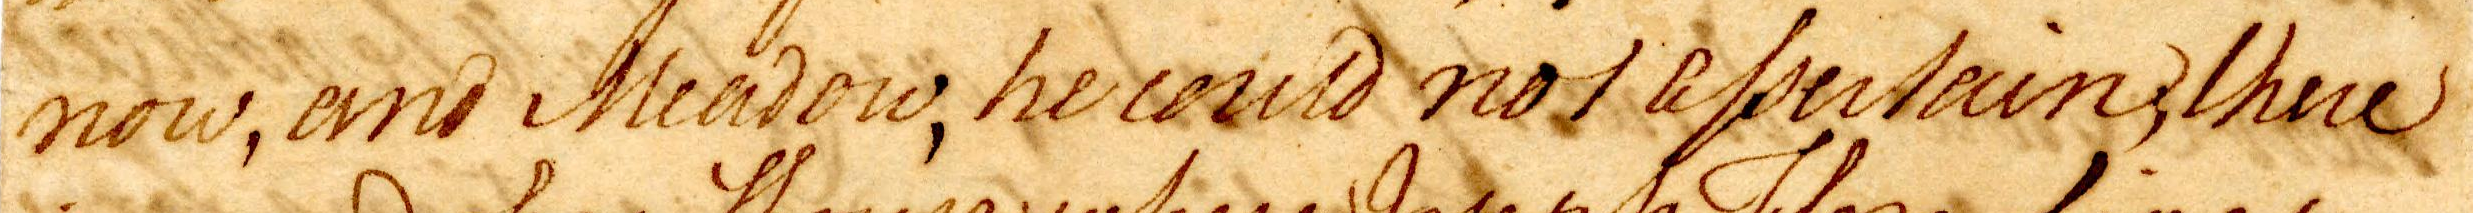now, and Meadow, he could not assertain, there
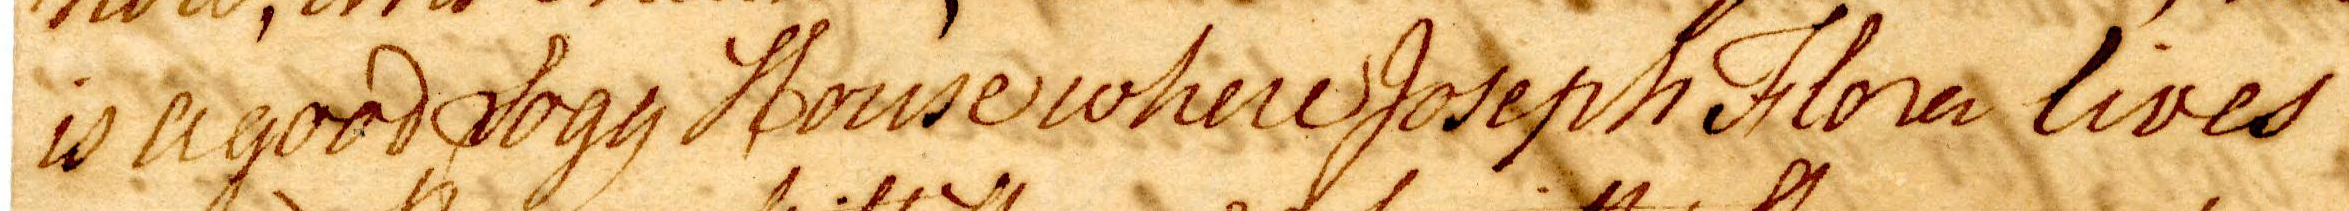is a good Logg House where Joseph Flora lives
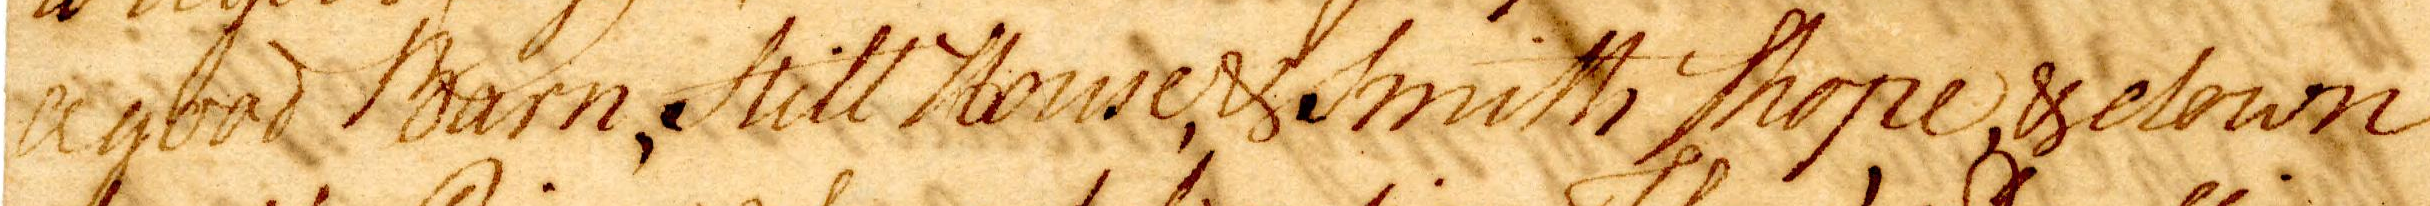a good Barn, Still House, & Smith Shope, & down
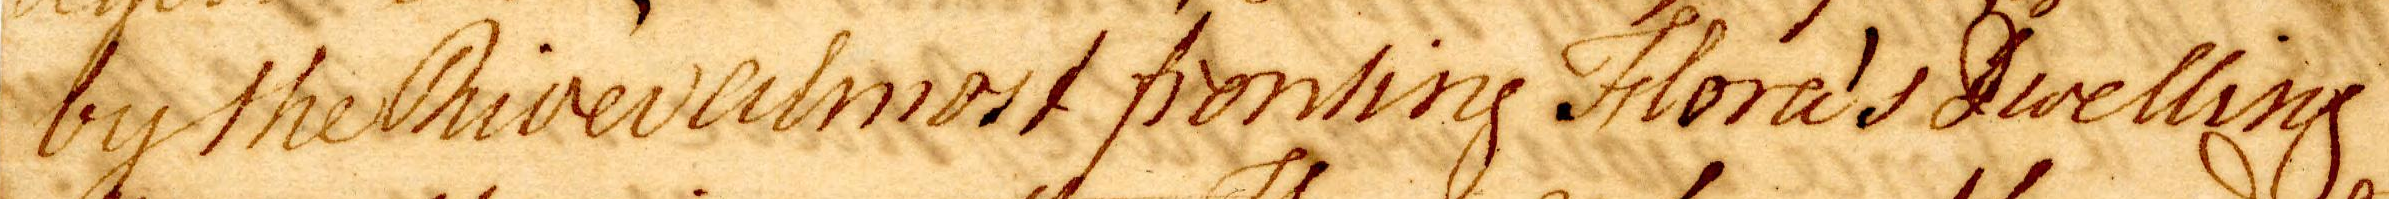by the River almost Fronting Flora's Dwelling
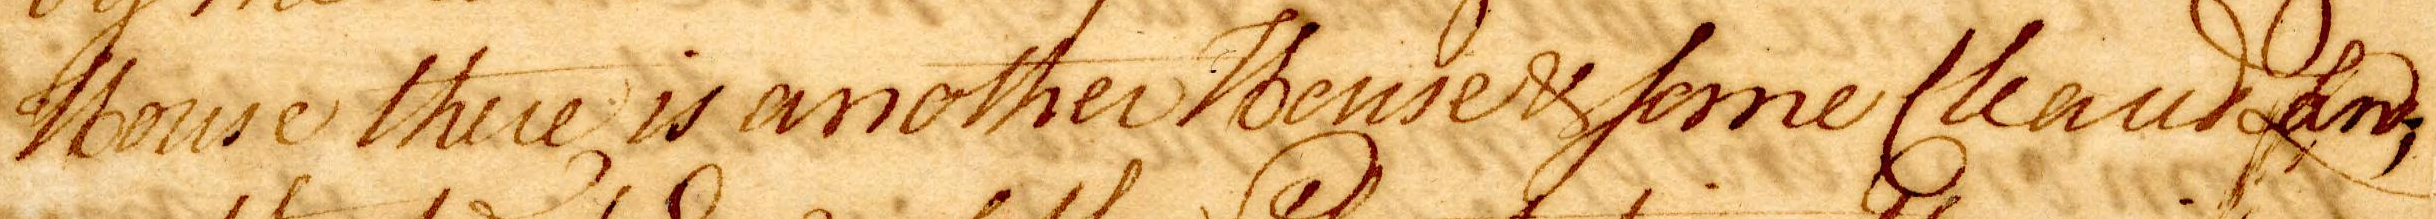House there, is another House & some Cleared Land
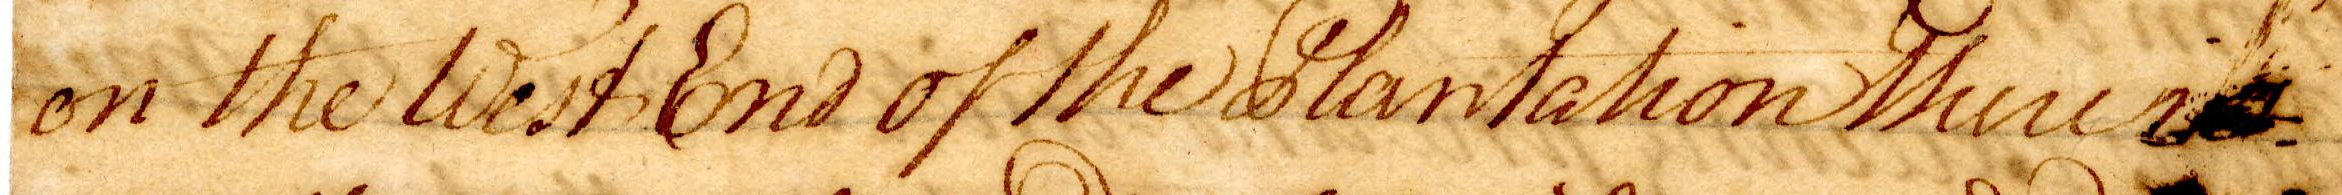on the West End of the Plantation there is
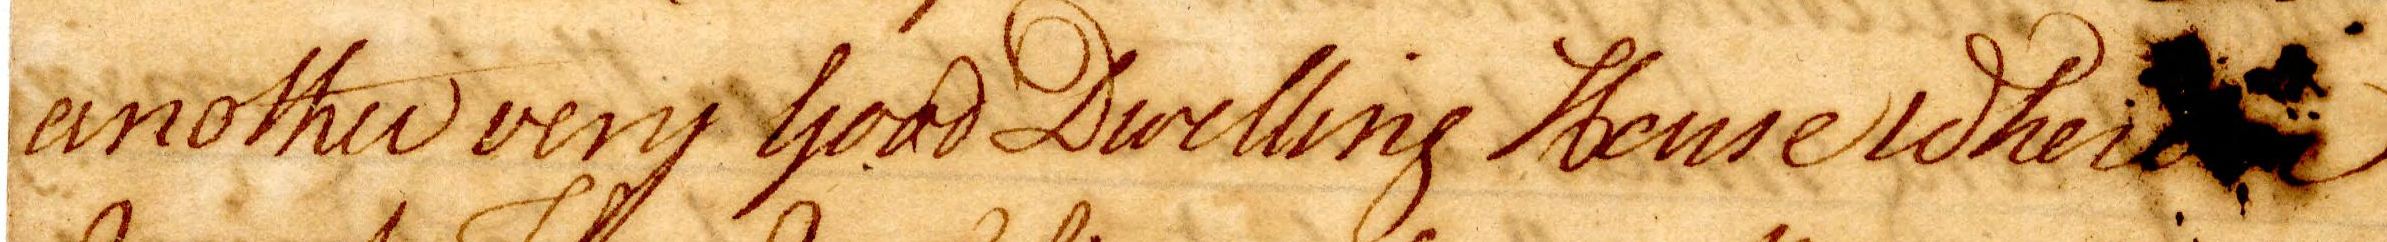another very Good Dwelling House where
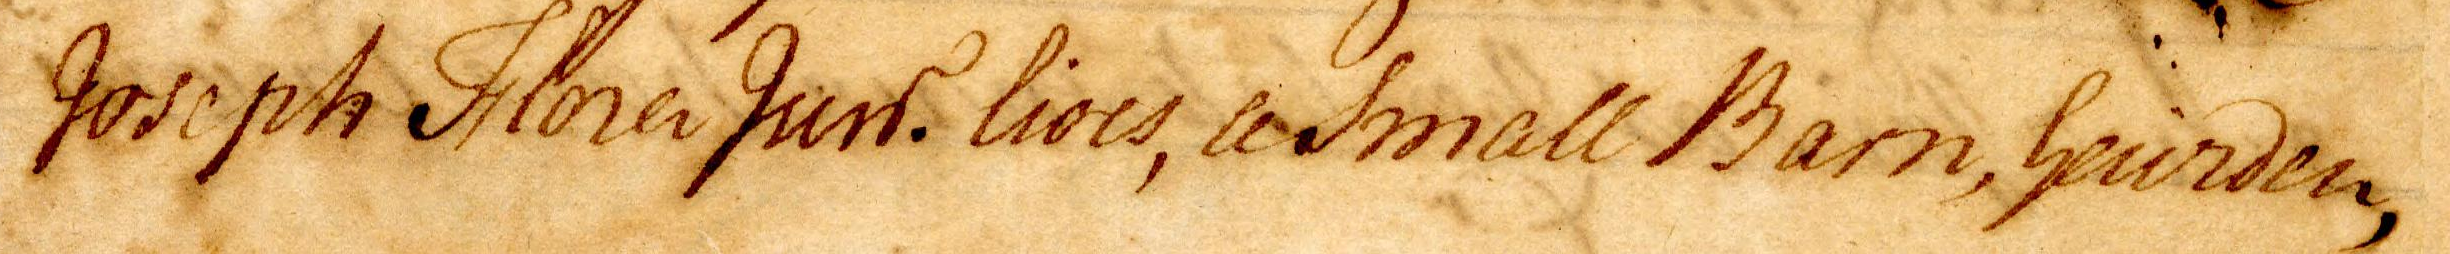Joseph Flora Jun. lives, a Small Barn, Garden,
